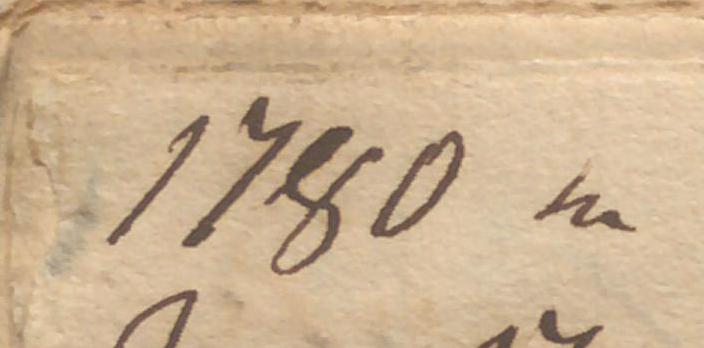1780
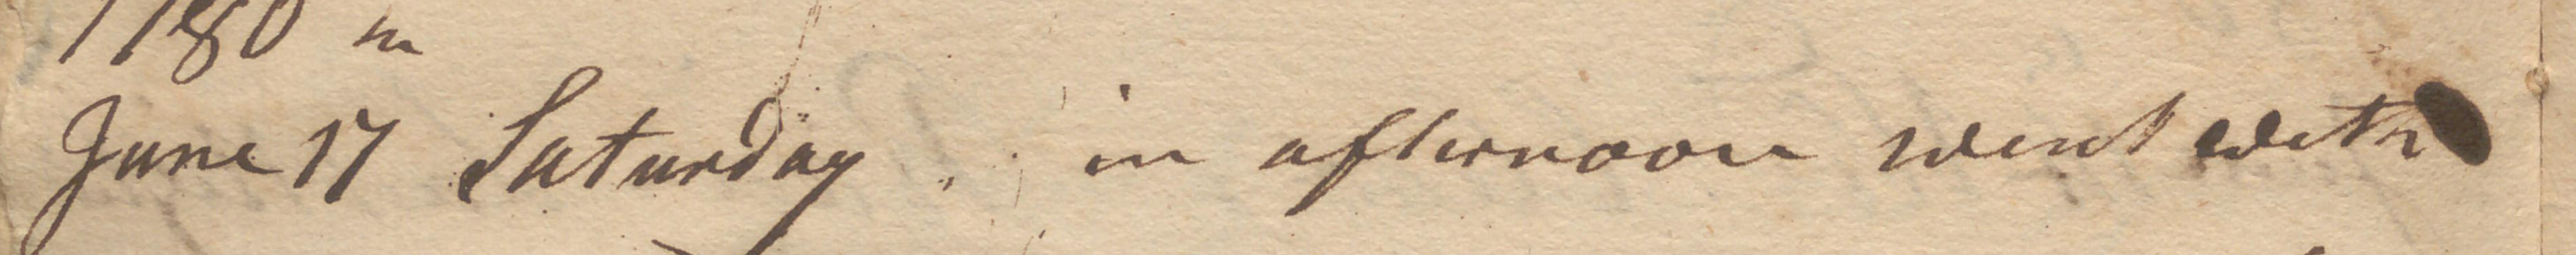June 17 Saturday, in afternoon went with
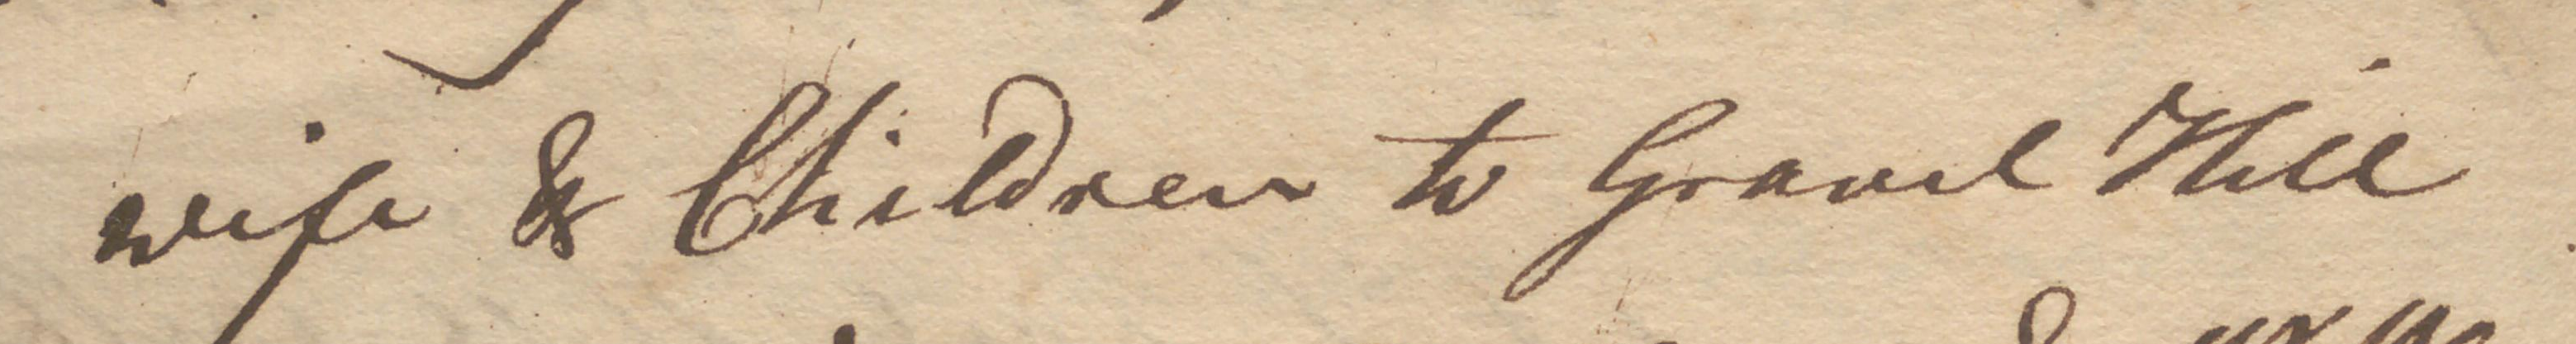wife & Children to Gravel Hill
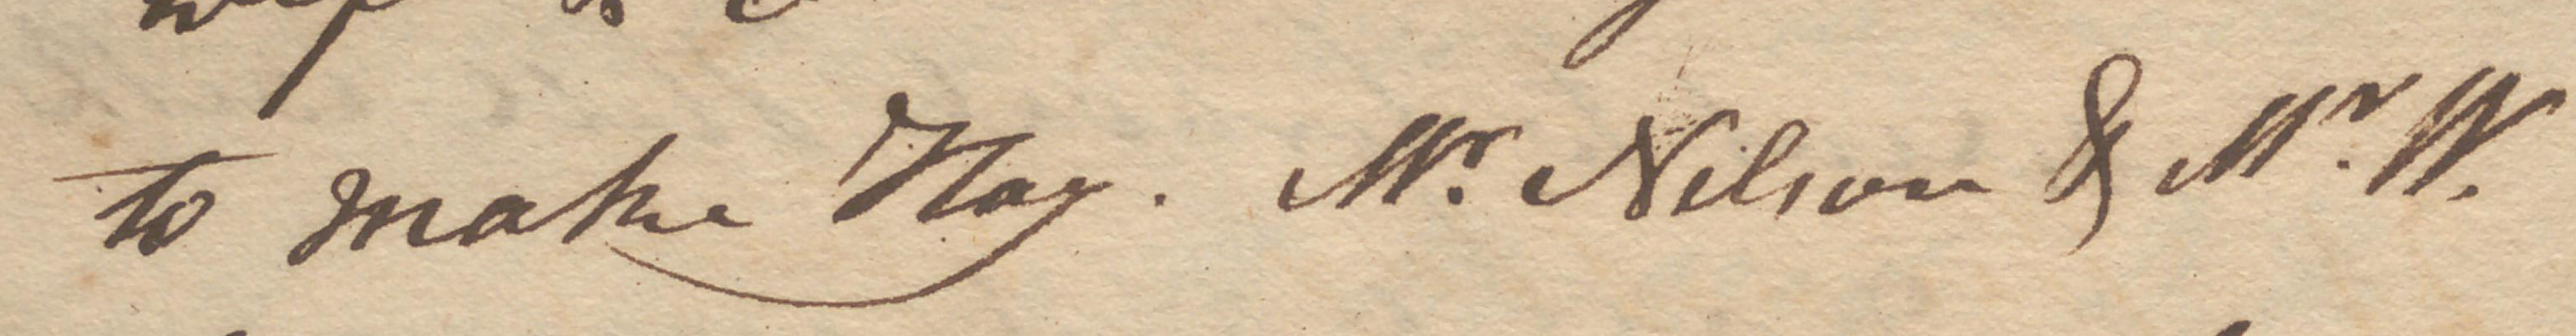to make Hay. M^r. Nelson & M^r. W.
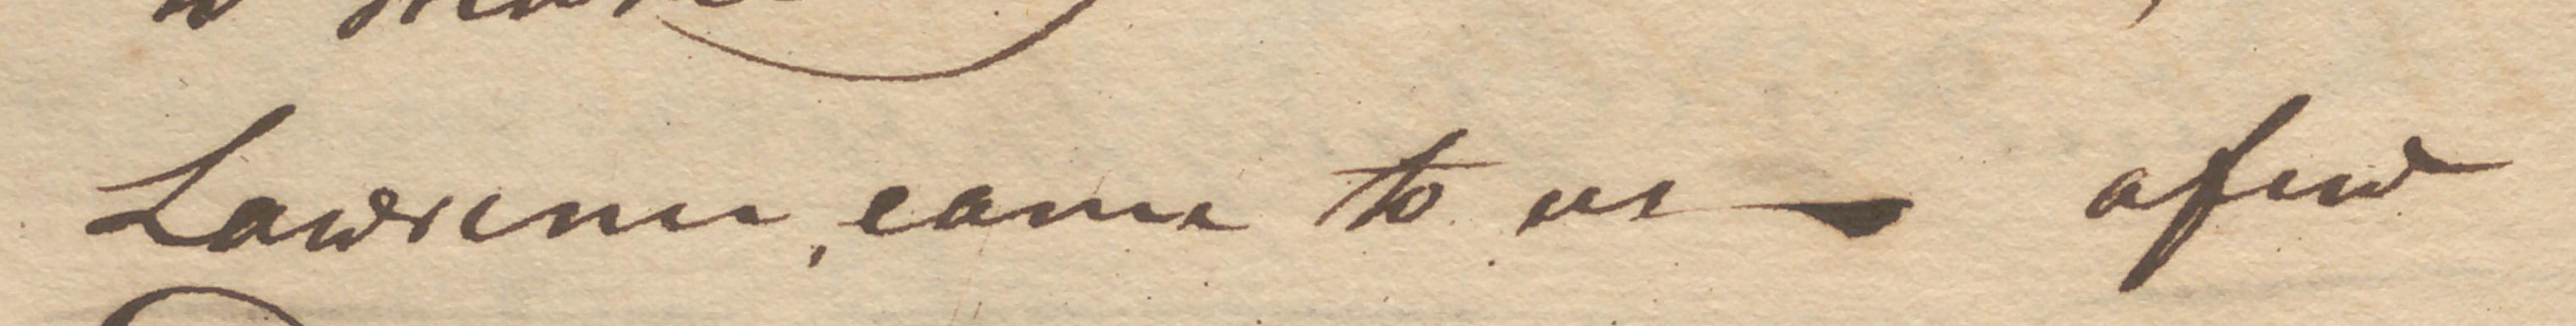Lawrence came to us- a few
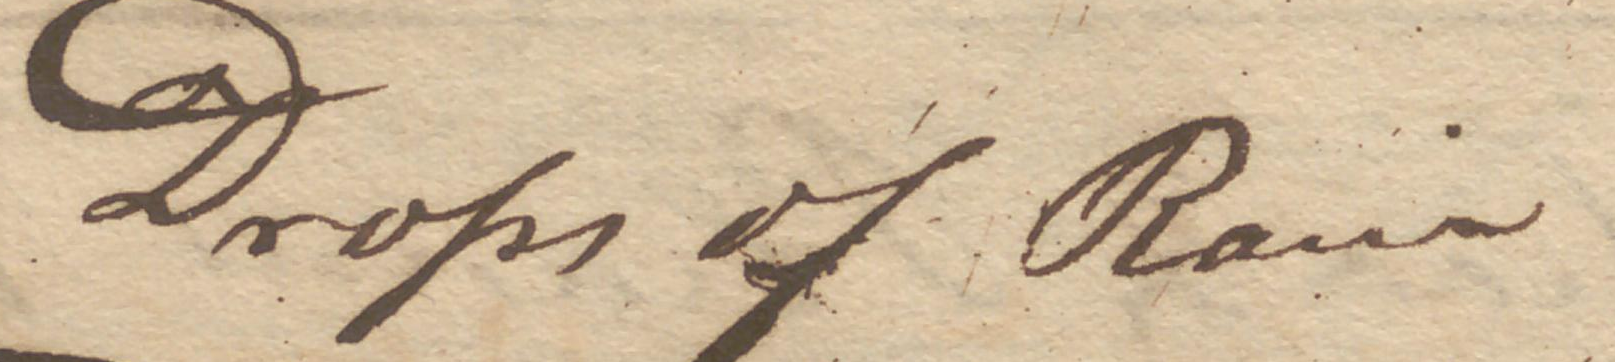Drops of Rain
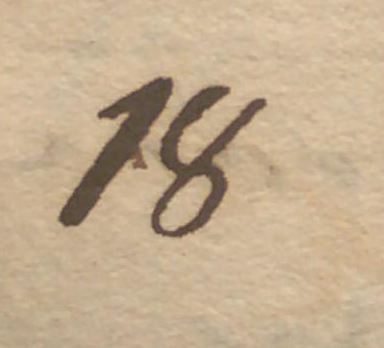18
